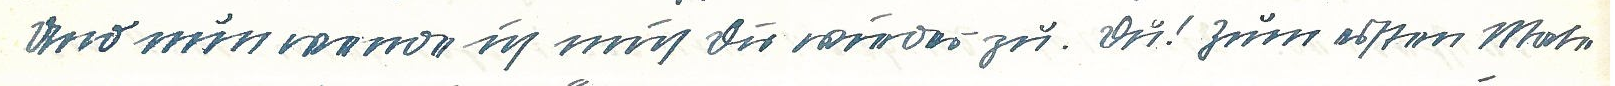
Und nun wende ich mich Dir wieder zu. Du! Zum ersten Male
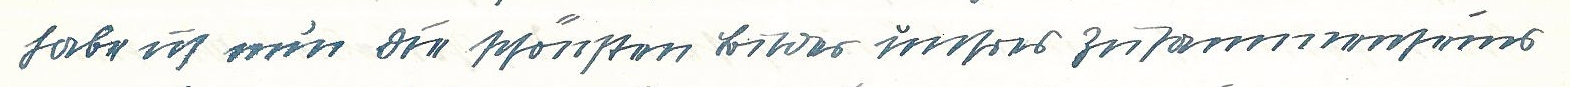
habe ich nun die schönsten Bilder unsres Zusammenseins
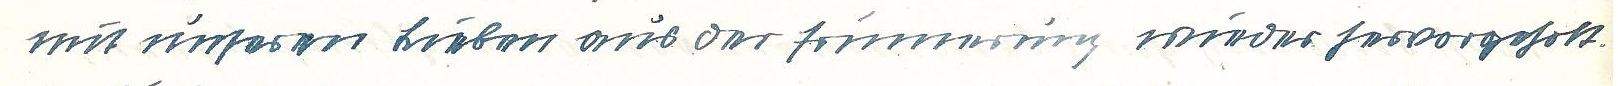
mit unseren Lieben aus der Erinnerung wieder hervorgeholt.
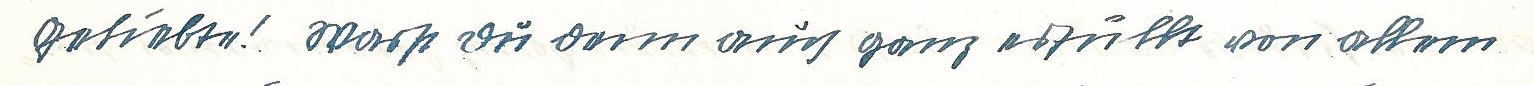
Geliebte! Warst Du denn auch ganz erfüllt von allem
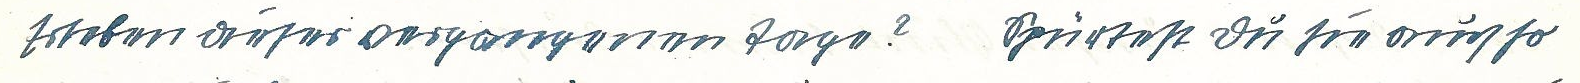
Erleben dieser vergangenen Tage? Spürtest Du sie auch so
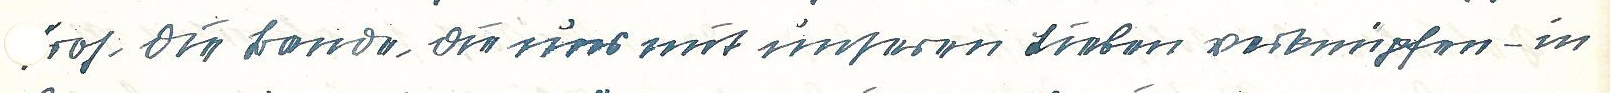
roh, die Bande, die uns mit unseren Lieben verknüpfen – in
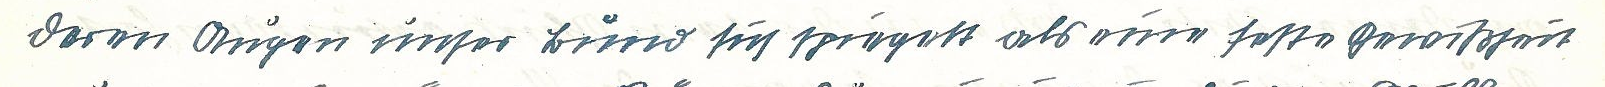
deren Augen unser Bund sich spiegelt als eine feste Gewißheit
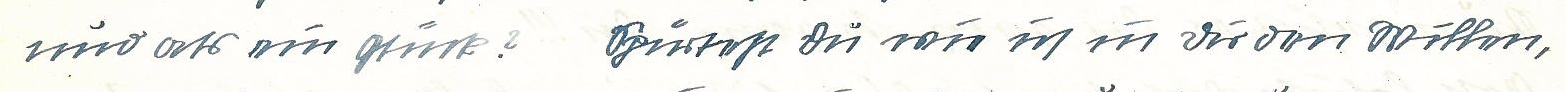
und als ein Glück: Spürst Du wie ich in Dir den Willen,
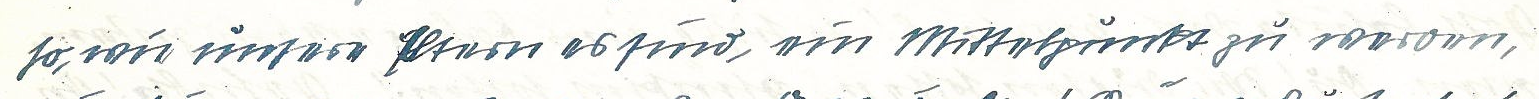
so, wie unsere Eltern es sind, ein Mittelpunkt zu werden,
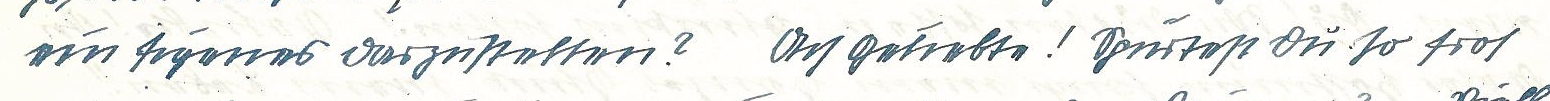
ein Eigenes darzustellen? Ach Geliebte! Spürtest Du so froh
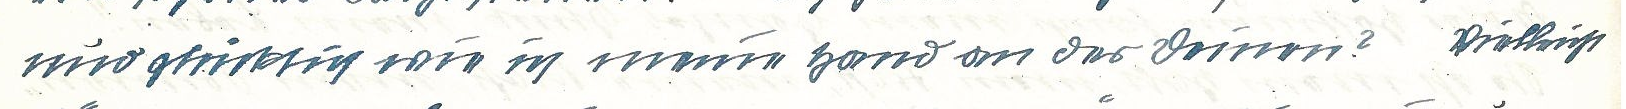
und glücklich wie ich meine Hand an der Deinen? Vielleicht
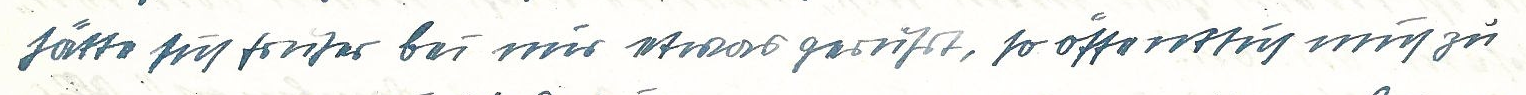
hätte sich früher bei mir etwas gerührt, so öffentlich mich zu
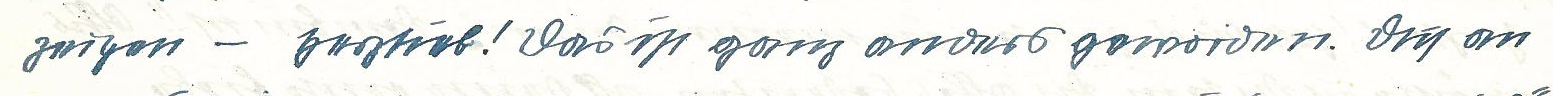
zeigen – Herzlieb! Das ist ganz anders geworden. Dich an
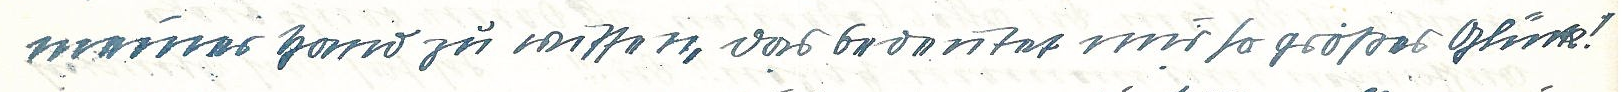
meiner Hand zu wissen, das bedeutet mir so großes Glück!
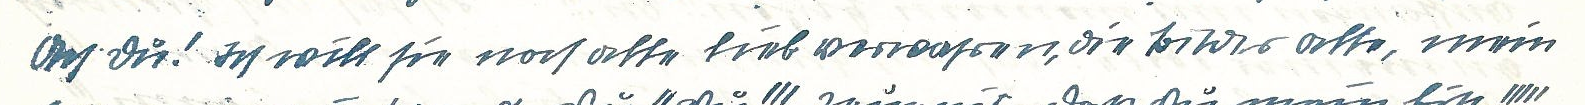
Ach Du! ich will sie noch alle lieb verwahren, die Bilder alle, mein
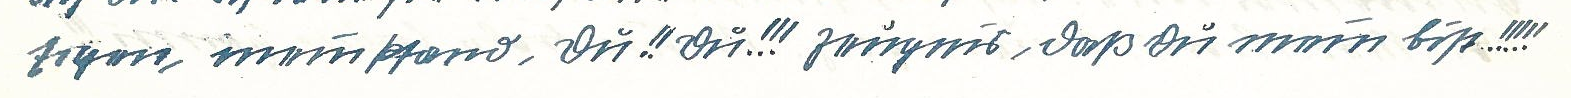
Eigen, mein Pfand, Du!! Du!!! Zeugnis, daß Du mein bist!!!!!
